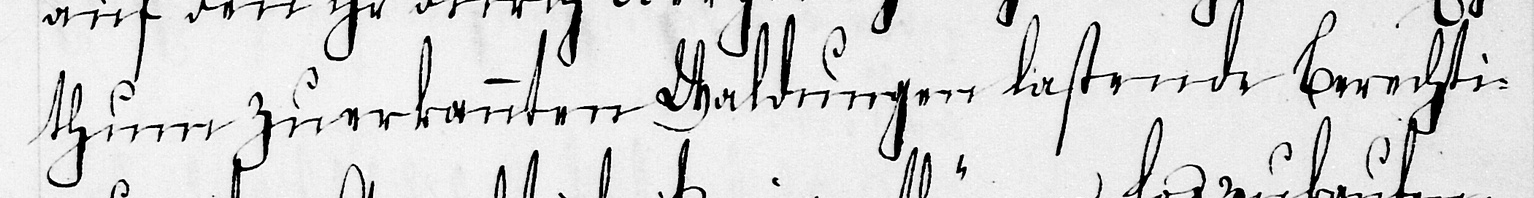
thum zuerkannten Waldungen lastende Berechti¬
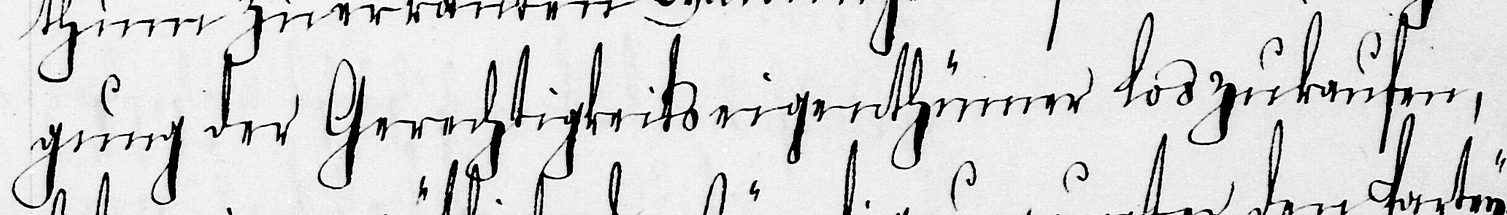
gung der Gerechtigkeitseigenthümer loszukaufen,
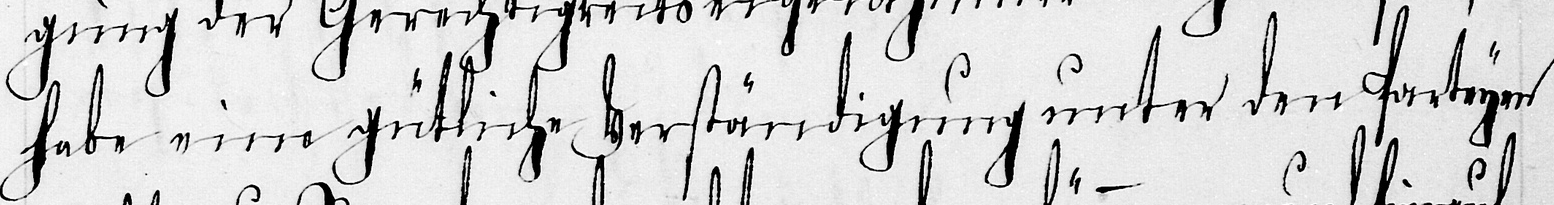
habe eine gütliche Verständigung unter den Parteyen
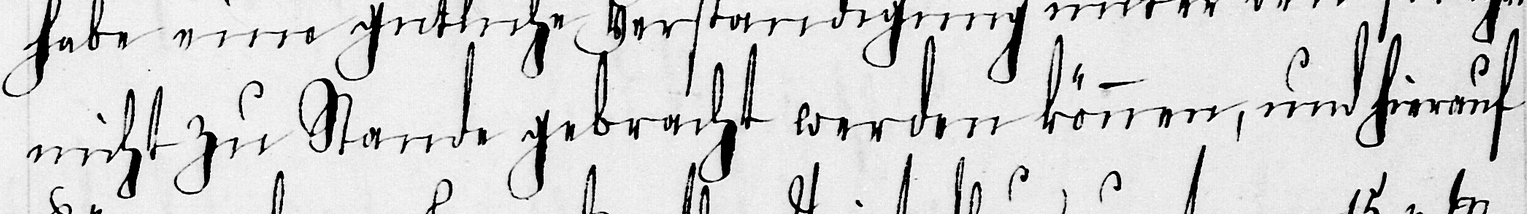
nicht zu Stande gebracht werden können, und hierauf
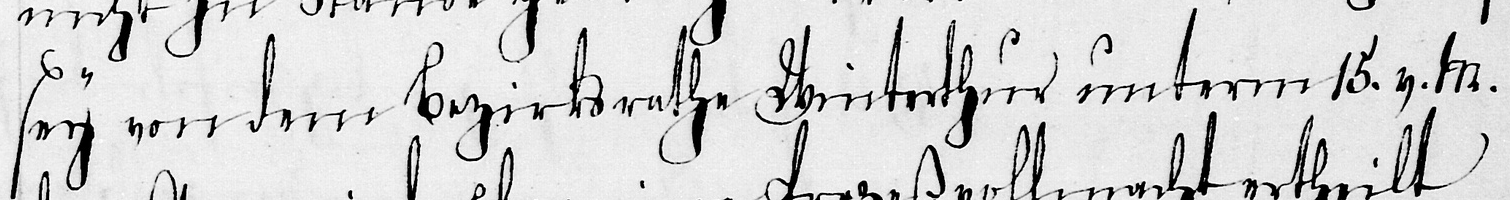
sey von dem Bezirksrathe Winterthur unterm 15. v. M.
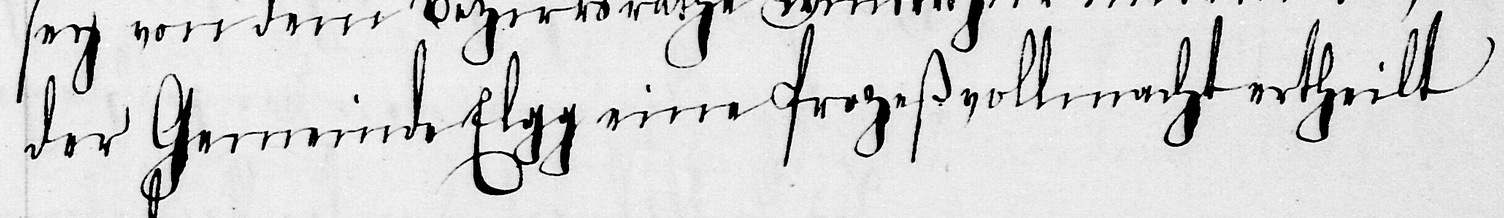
der Gemeinde Elgg eine Prozeßvollmacht ertheilt
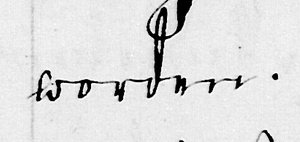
worden.
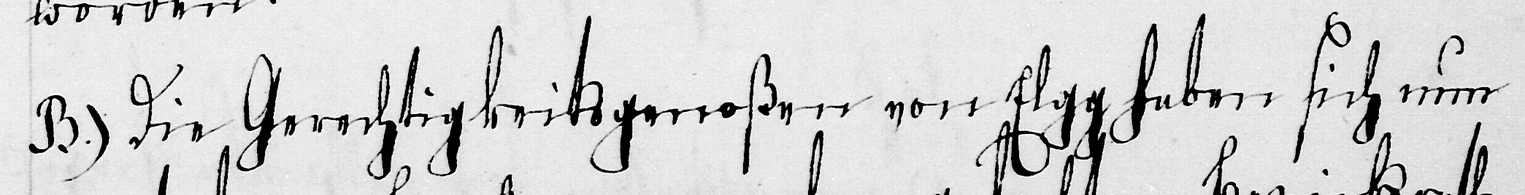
B.) Die Gerechtigkeitsgenoßen von Elgg haben sich nun
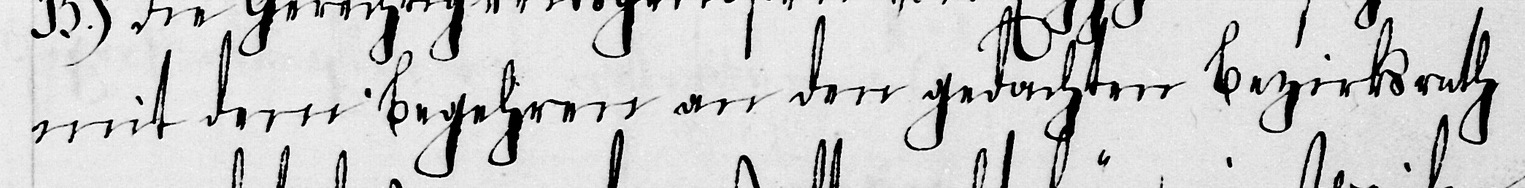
mit dem Begehren an den gedachten Bezirksrath
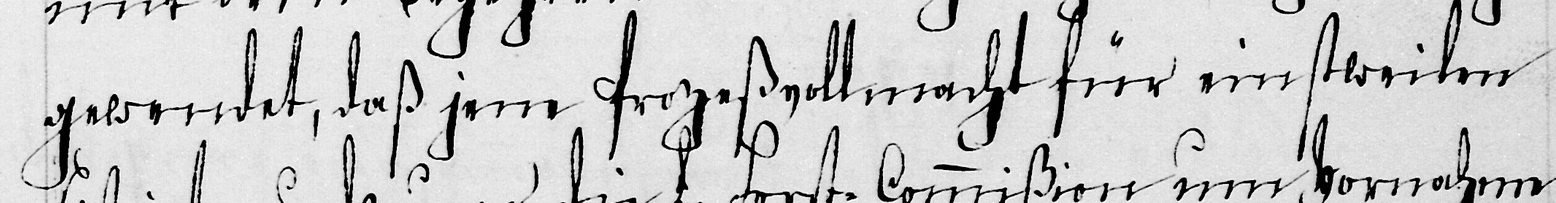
gewendet, daß jene Prozeßvollmacht für einstweilen
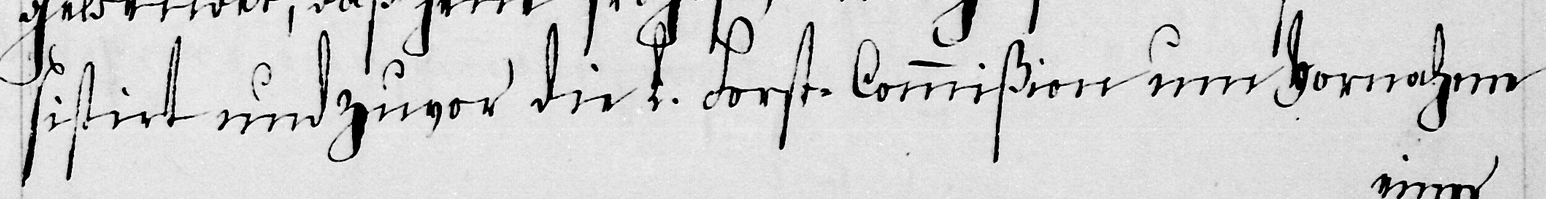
sistirt und zuvor die L. Forst-Commißion um Vornahme
